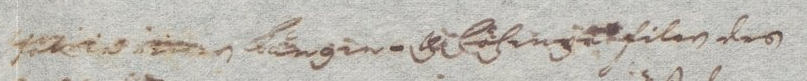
sowie eines Längen-& Höhenprofiles des
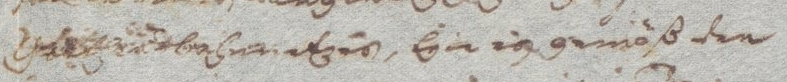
Gotthardbahnnetzes, wie es gemäß den
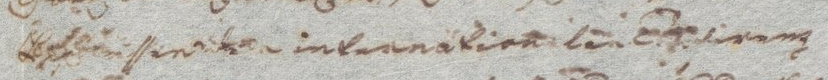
Beschlüssen der internationalen Conferenz
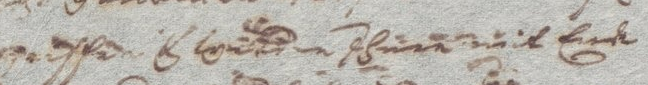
begriffen & würden Ihnen mit Ende
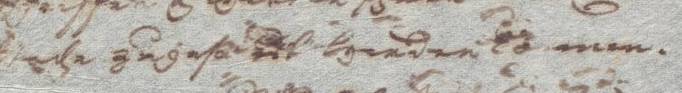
Woche zugesandt werden können.
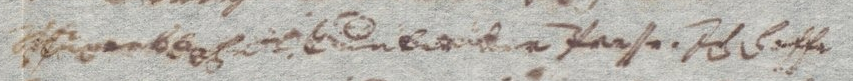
Splügenbahn ist unter der Presse. Ich hoffe
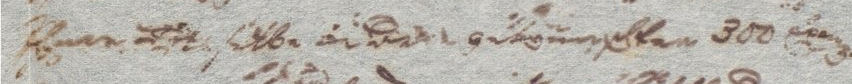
Ihnen dieselbe in den gewünschten 300 Exemp-
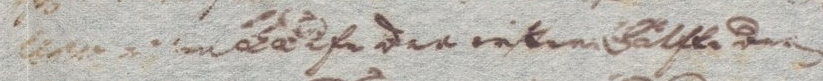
laren im Laufe der ersten Hälfte der
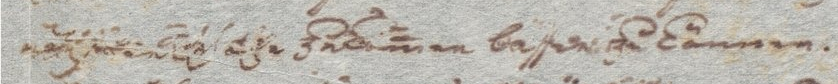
nächsten Woche zukommen lassen zu können.
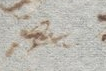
end-
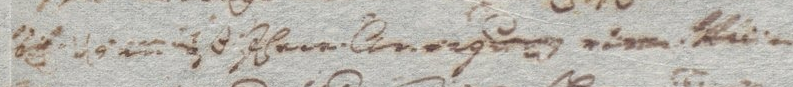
lich gemäß Ihrer Anregung eine kleine
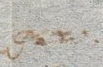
gen.
